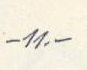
11
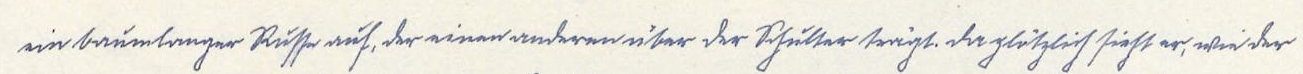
ein baumlanger Russe auf, der einen anderen über der Schulter trägt. Da plötzlich sieht er, wie der
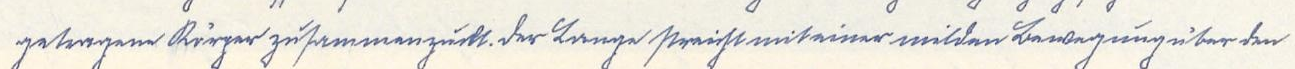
getragene Körper zusammenzuckt. Der Lange streicht mit einer milden Bewegung über den
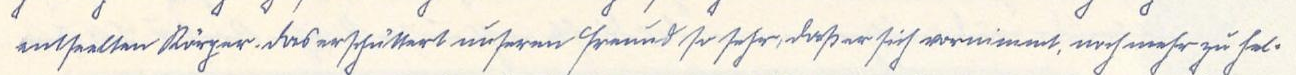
entstellten Körper. Das erschüttert unseren Freund so sehr, dass er sich vornimmt, noch mehr zu hel-
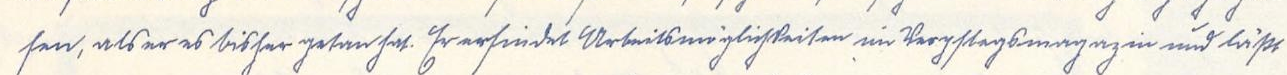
fen, als er es bisher getan hat. Er erfindet Arbeitsmöglichkeiten im Verpflegungsmagazin und lässt
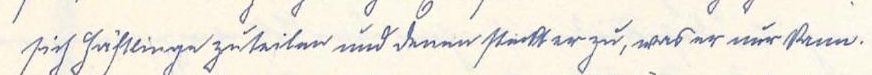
sich Häftlinge zuteilen und denen steckt er zu, was er nur kann.
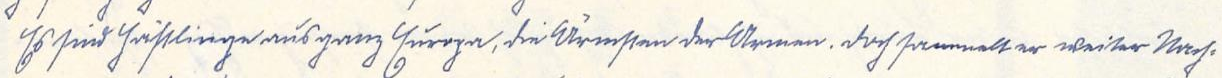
Es sind Häftlinge aus ganz Europa, die Ärmsten der Armen. Doch sammelt er weiter Nach-
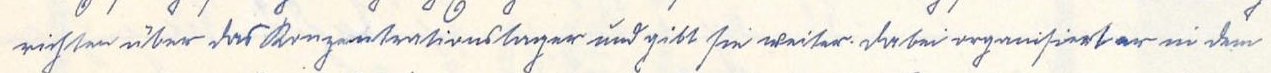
richten über das Konzentrationslager und gibt sie weiter. Dabei organisiert er in dem
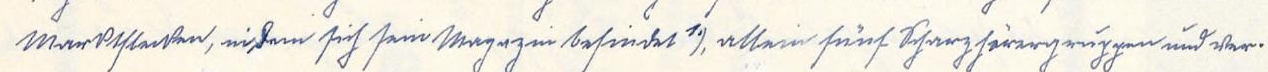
Marktflecken, in dem sich sein Magazin befindet 1), allein fünf schanzfeuerung (?) und ver-
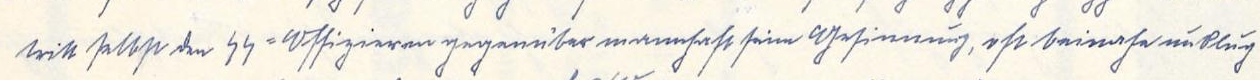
tritt selbst den SS-Offizieren gegenüber namhaft seine Gesinnung, oft beinahe unklug
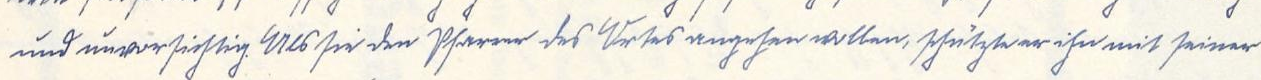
und unvorsichtig. Als sind dem Pfarrer des Ortes angehen wollen, schützte er ihn mit seiner
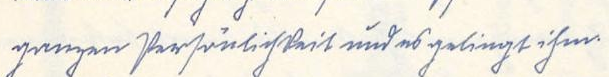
ganzen Persönlichkeit und es gelingt ihm.
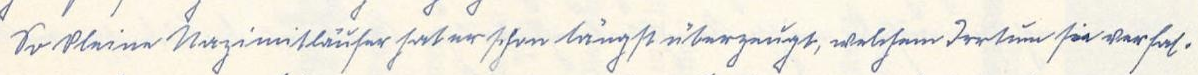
So kleine Nazimitläufer hat er schon längst überzeugt, welchen Irrtum sie verfal-
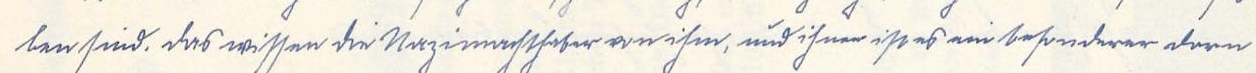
len sind. Das wissen die Nazimachthaber von ihm, und ihnen ist es am ein besonderer Dorn
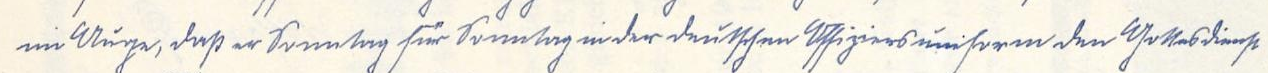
im Auge, dass er Sonntag für Sonntag in der deutschen Offiziersuniform den Gottesdienst
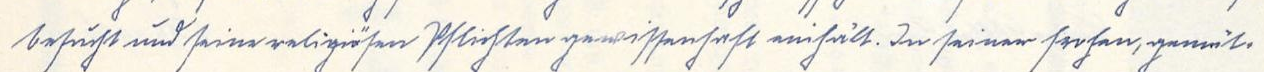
besucht und seine religiösen Pflichten gewissenhaft einhält. In seiner frohen, gemüt-
